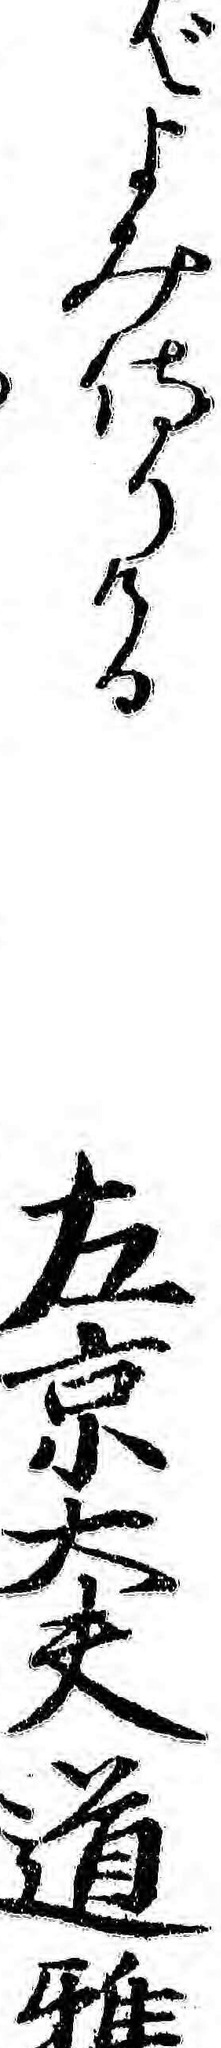ばよみ侍りける左京大夫道雅
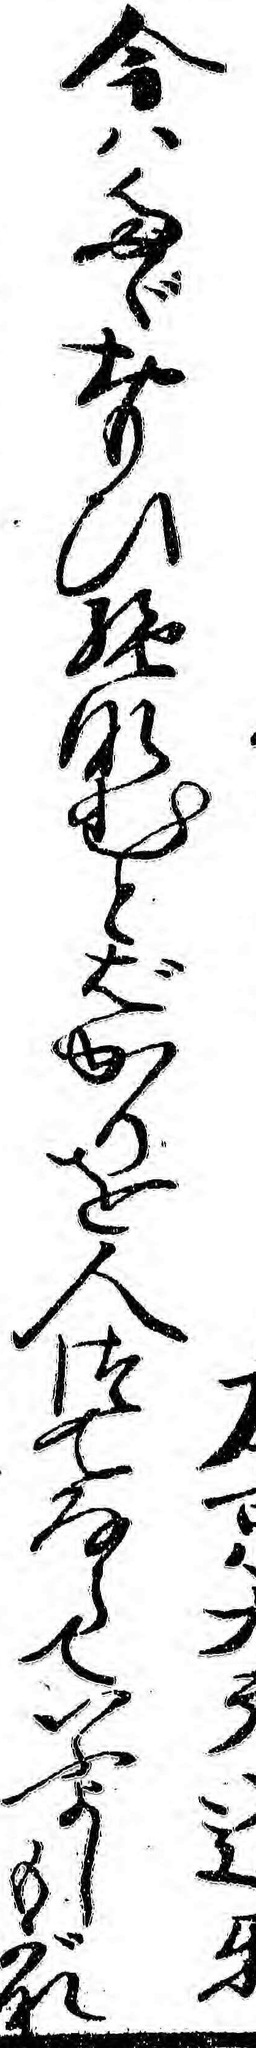今はたゞおもひ絶なむとばかりを人づてならでいふよしもがな
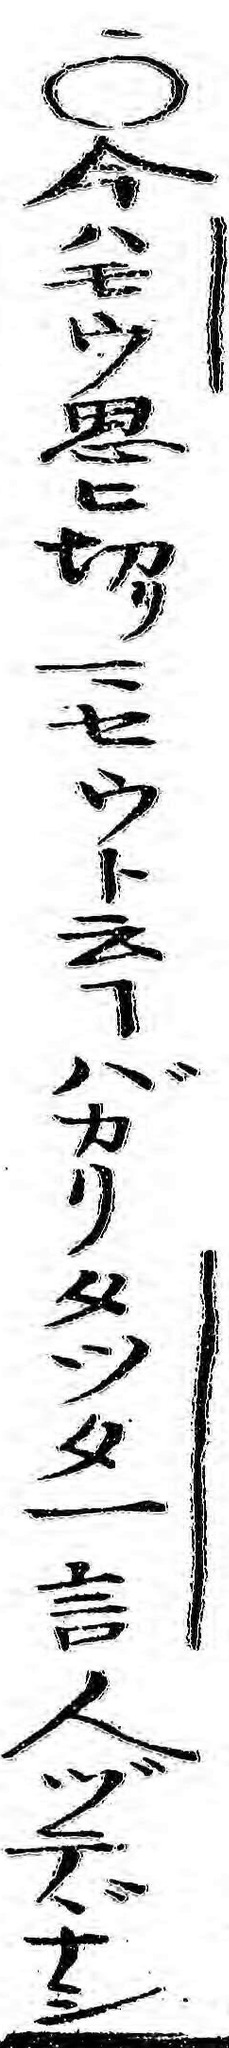○今ハモウ思ヒ切リマセウト云コトバカリタツタ一言人ヅテヾナシ
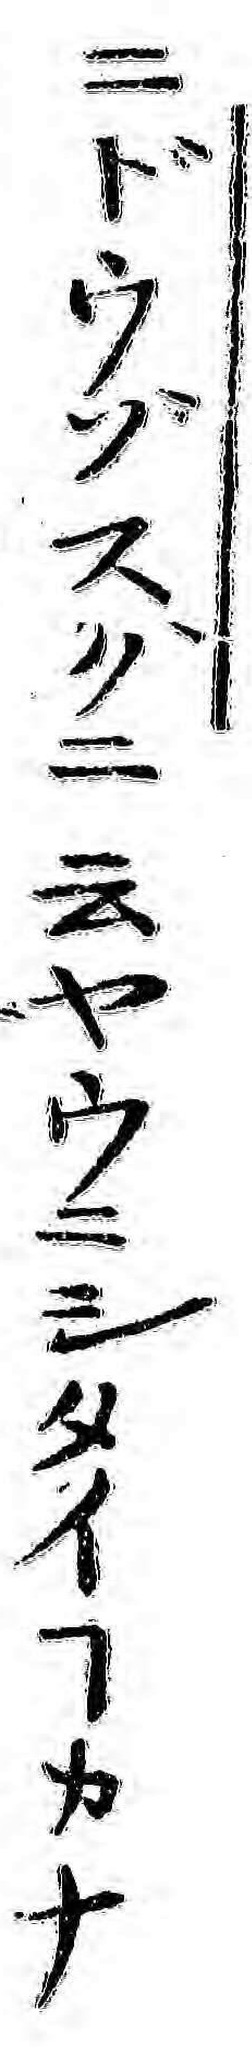ニドウゾスグニ云ヤウニシタイコトカナ
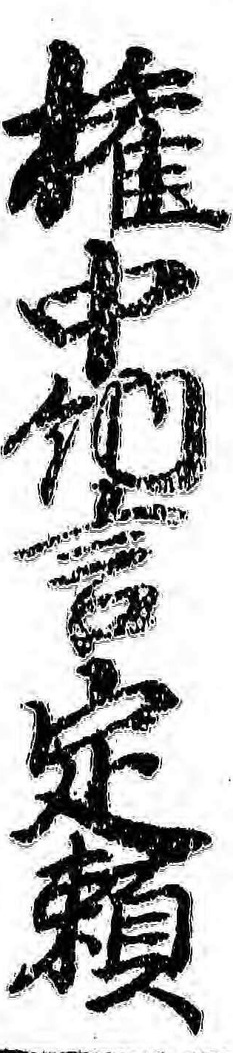権中納言定頼
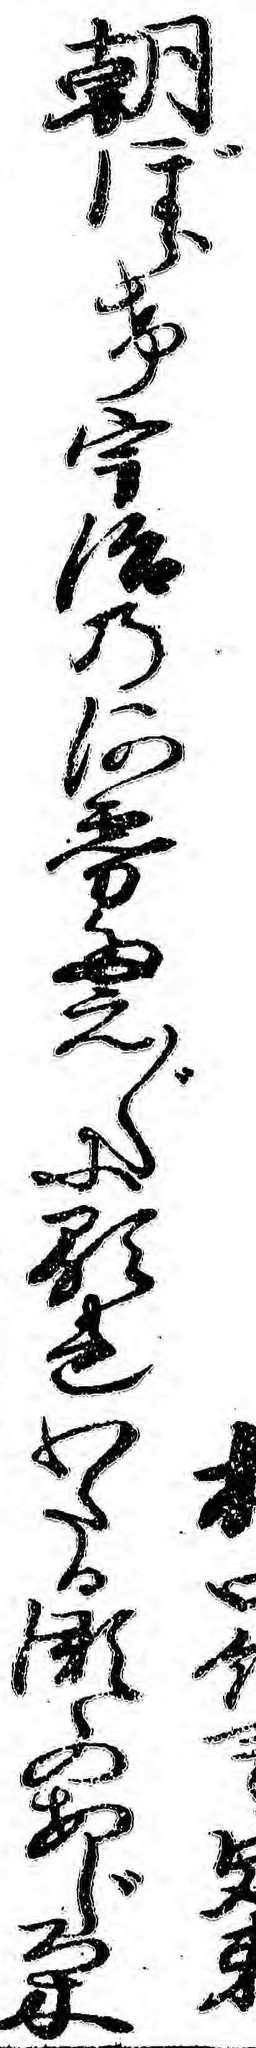朝ぼらけ宇治の河霧たえ〴〵に顕れわたる瀬々のあじろぎ
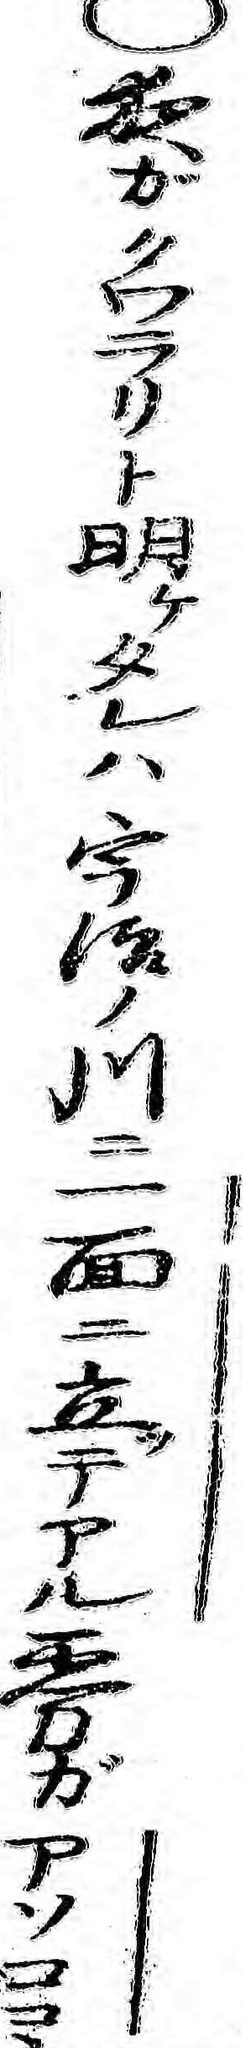○夜ガクワラリト明ケタレハ宇治ノ川ニ一面ニ立ツテアル霧ガアソココヽ
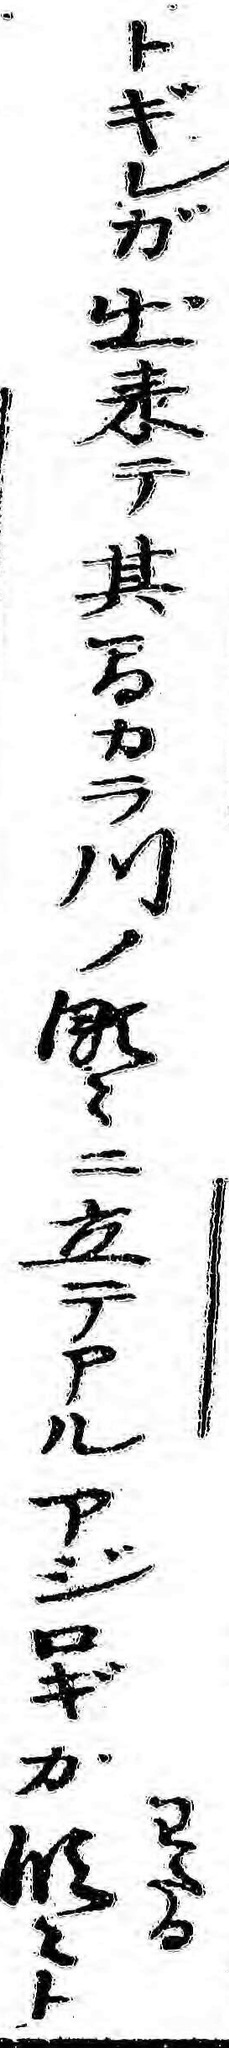トギレガ出来テ其間カラ川ノ瀬々ニ立テアルアジロギガ段々ト
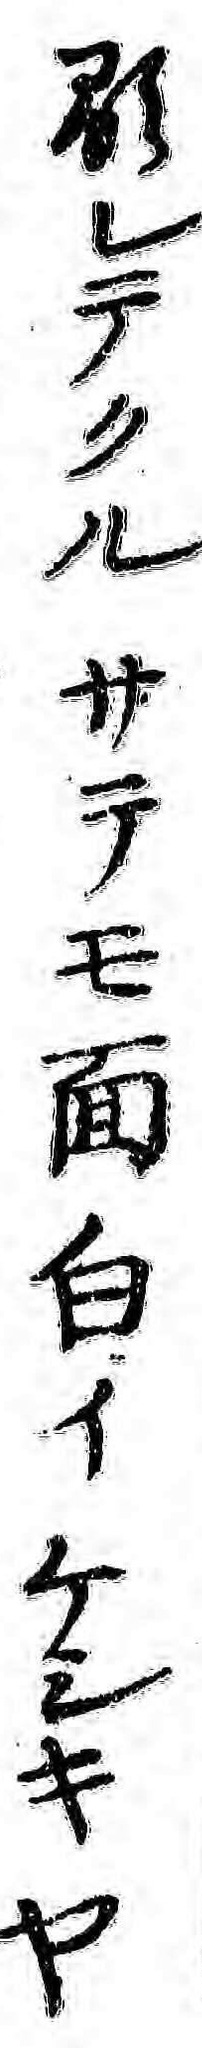顕レテクルサテモ面白イケシキヤ
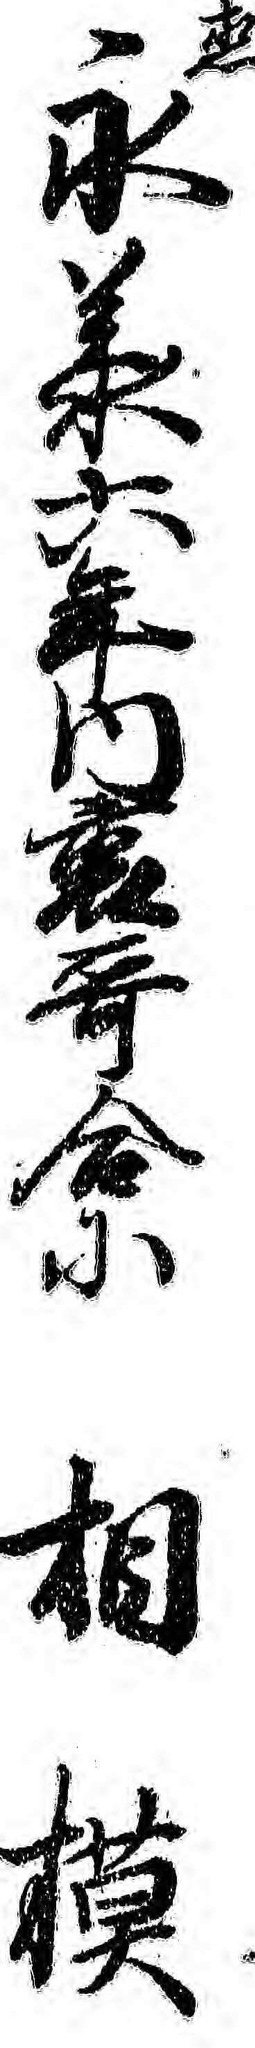後拾遺集恋永承六年内裏哥合に相模
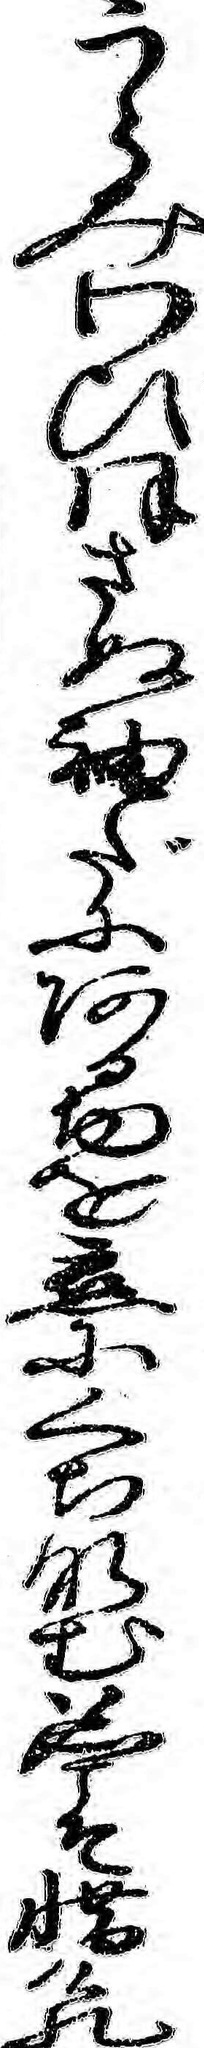うらみわびほさぬ袖だにある物を恋にくちなむ名こそ惜けれ
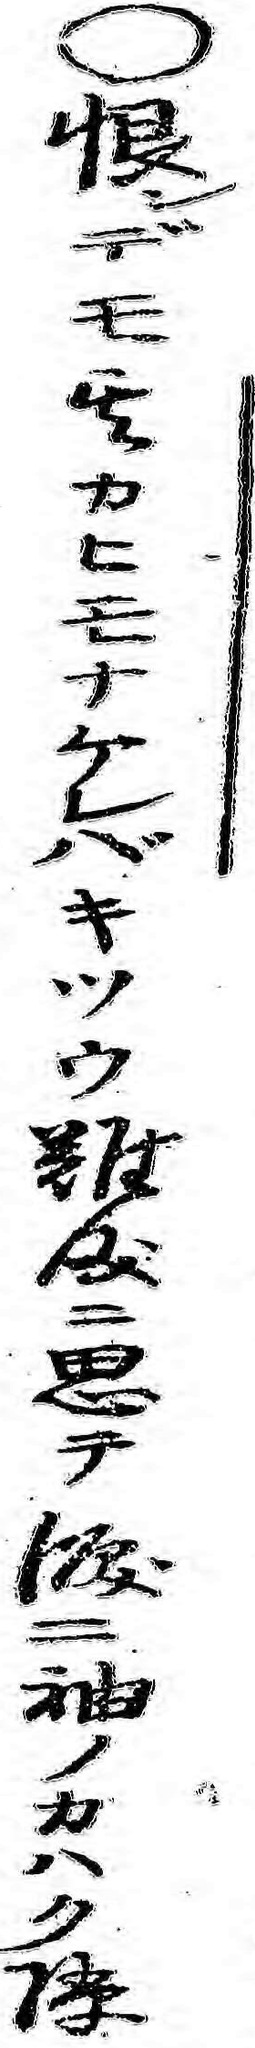○恨ンデモ其カヒモナケレバキツウ難成ニ思テ渡ニ袖ノカハク隙
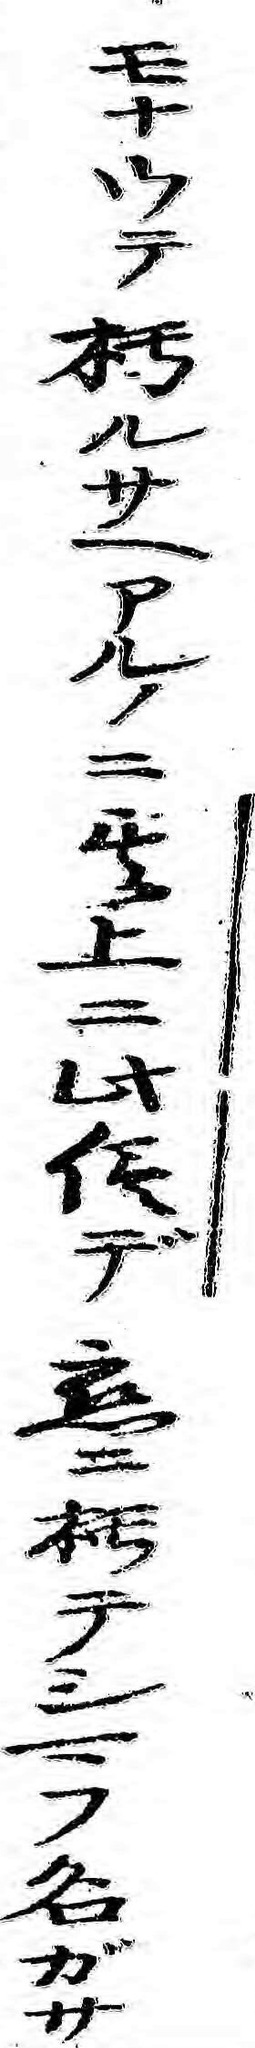モナウテ朽ルサヘアルノニ其上ニ此侭デ恋ニ朽テシマフ名ガサ

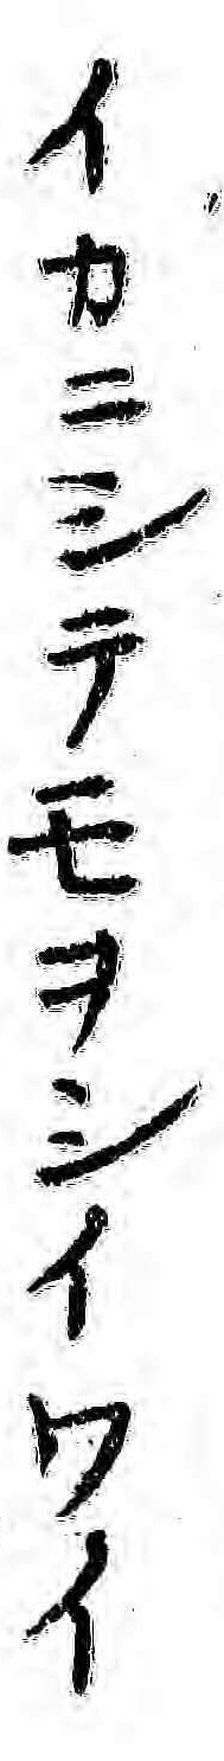イカニシテモヲシイワイ
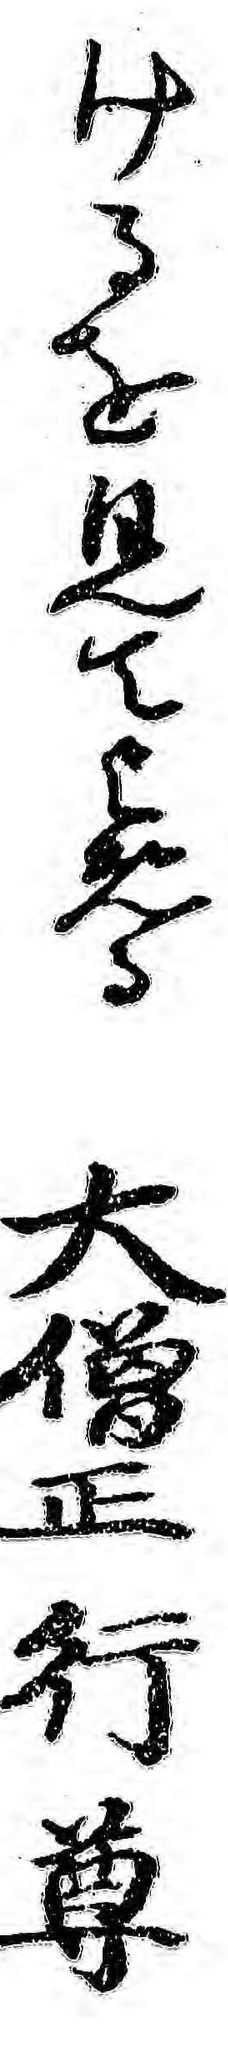けるを見てよめる大僧正行尊
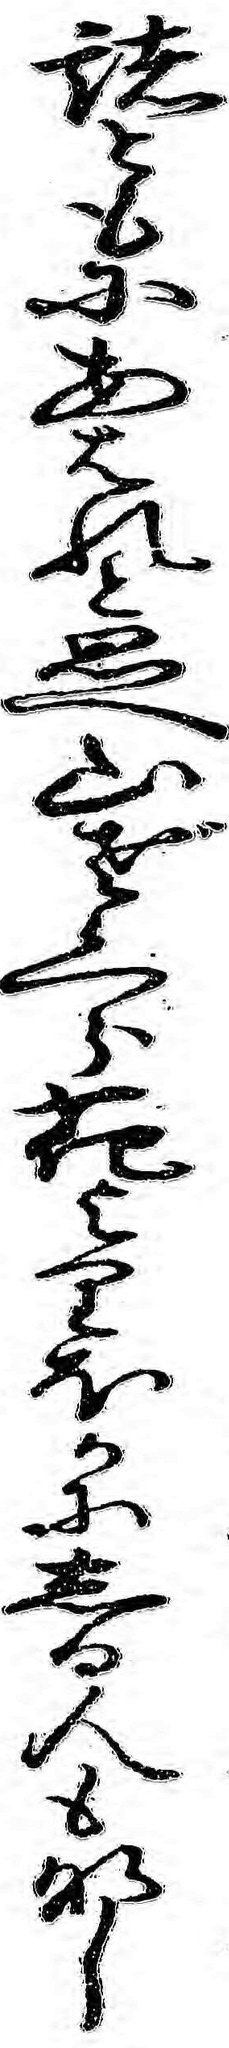諸ともにあはれと思へ山ざくら花よりほかにしる人もなし
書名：百人一首／小倉の山ふみ
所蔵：国文学研究資料館
